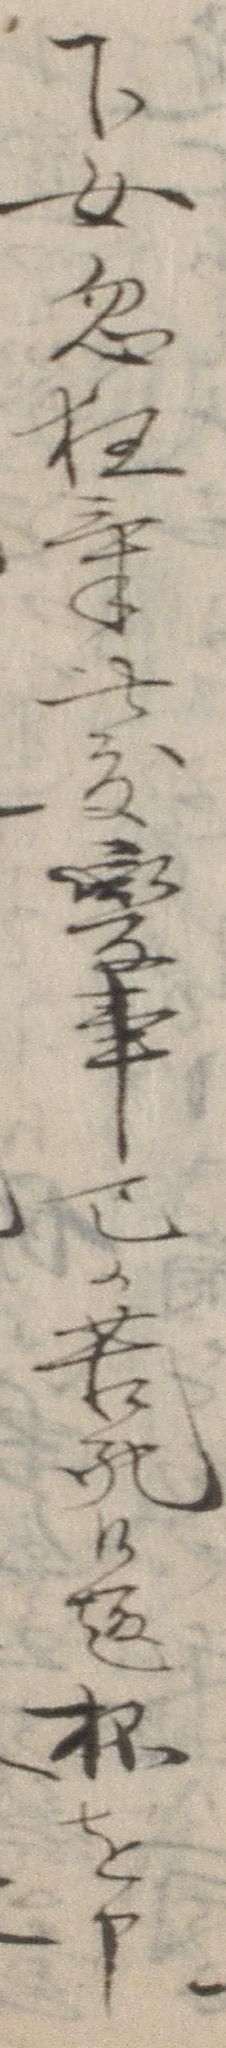下女忽狂気此度変事己か苦死候趣抔を申
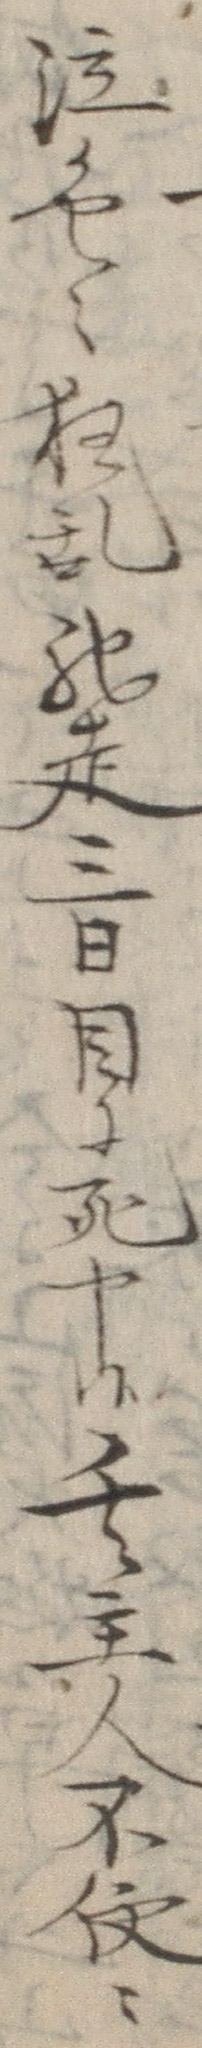泣かセ狂乱馳走三日目に死申候其主人不便ニ
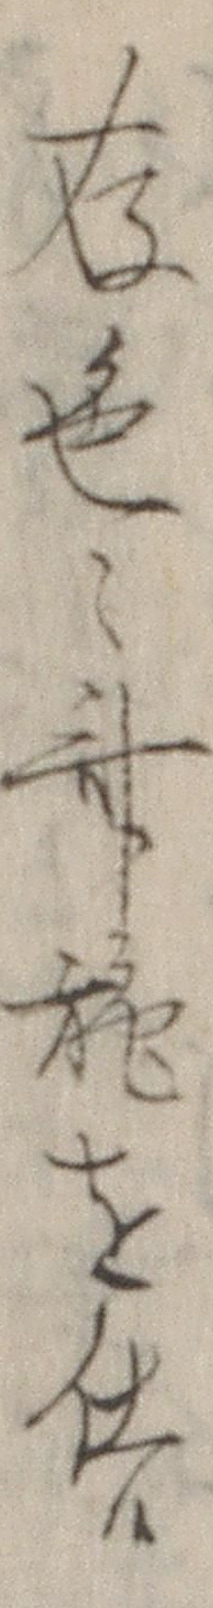存色々斎施を仕候
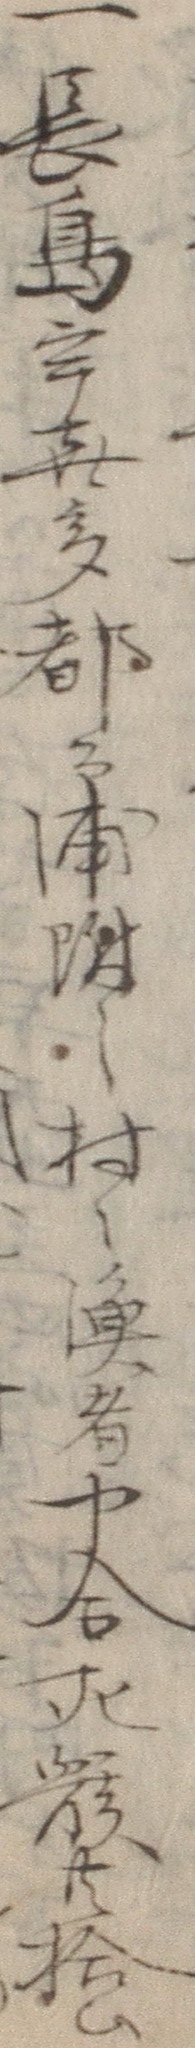一長島宇喜多郡は浦附之村々漁者申合死骸共拾ひ
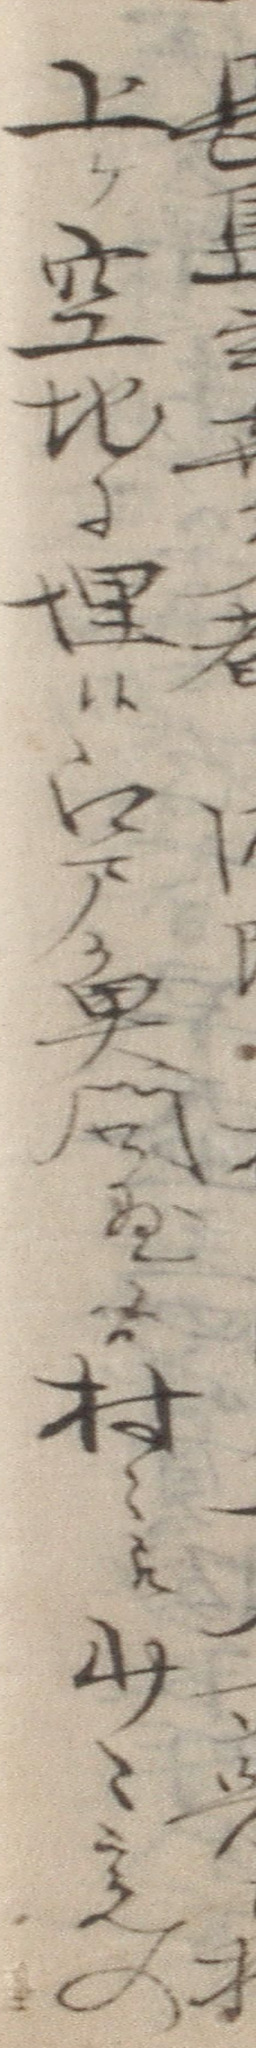上ケ空地に埋候江戸魚問屋ゟ村々江少々充の
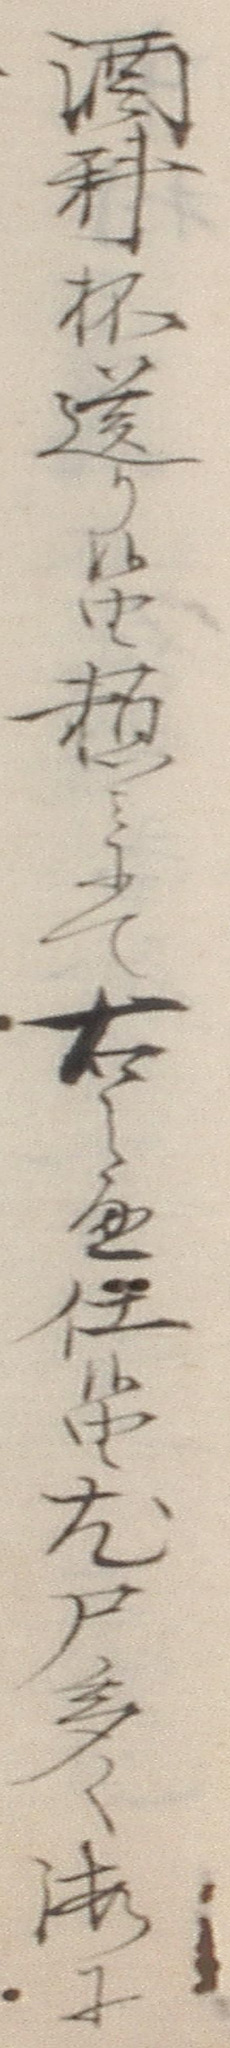酒料抔送り候由頼みにて右之通仕候由尤尸多く海に
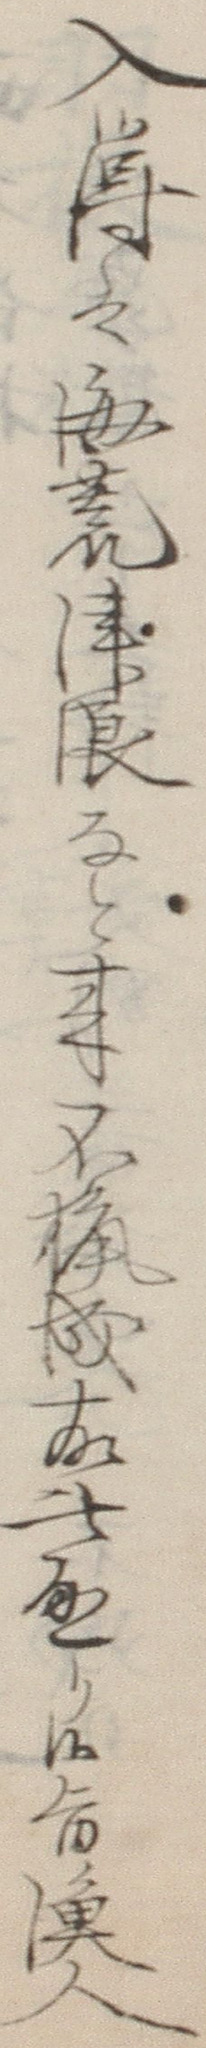入候得は海荒津浪なと来不猟成故此通り候旨漁人
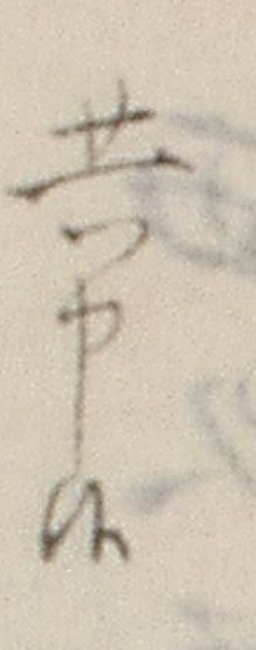共申候
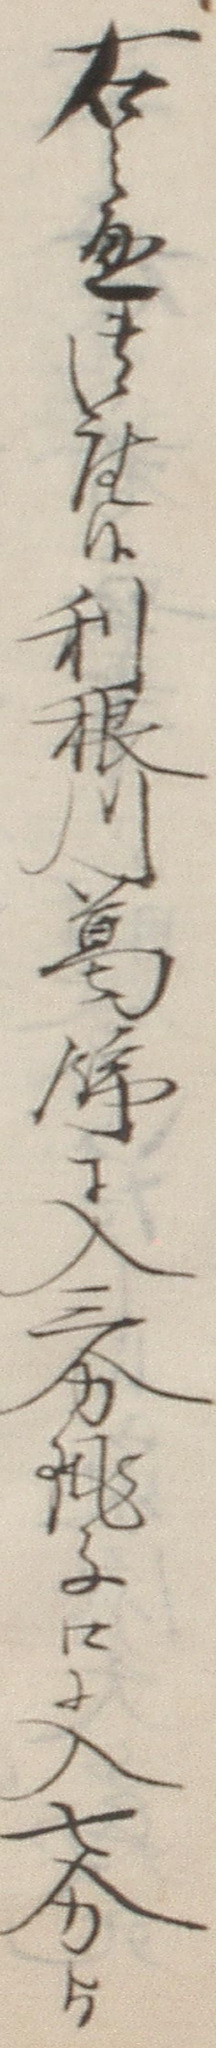右之通御座候利根川葛飾に入三分銚子口に入七分と
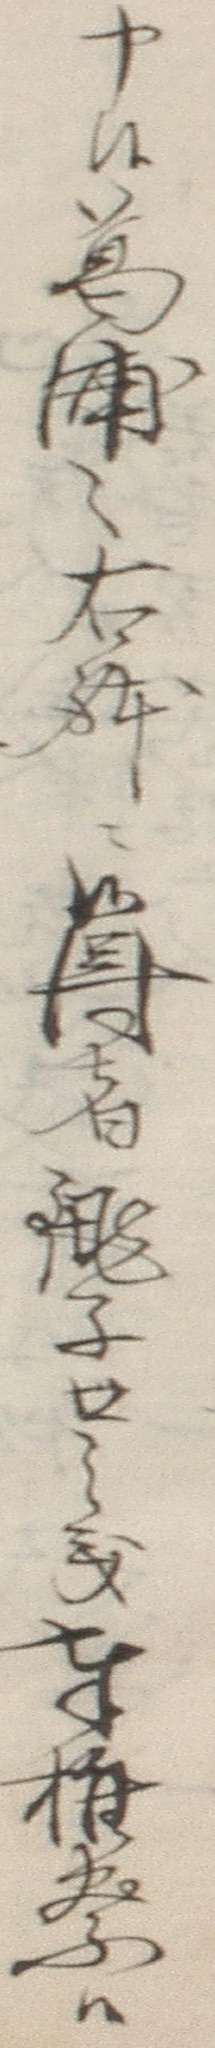申候葛浦々右体ニ候得者銚子口之義奉推察候
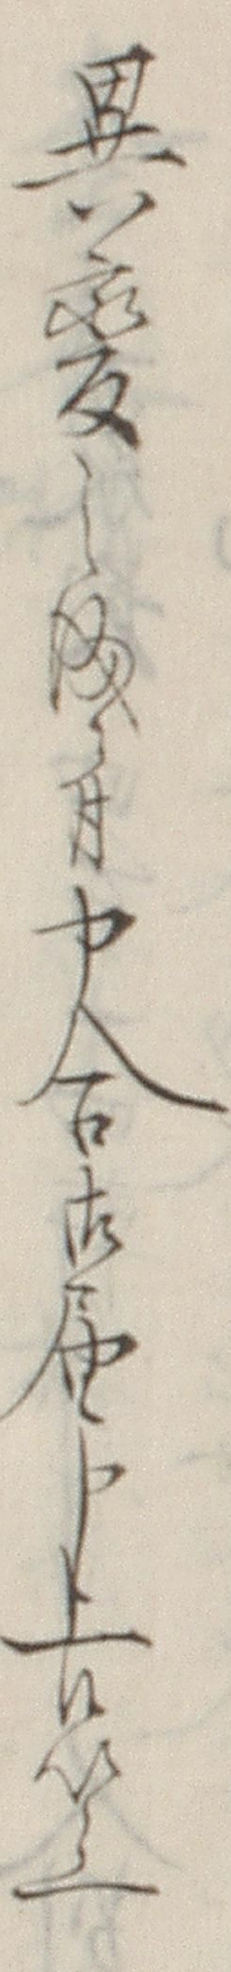異変之儀ニ付申合御届申上候以上
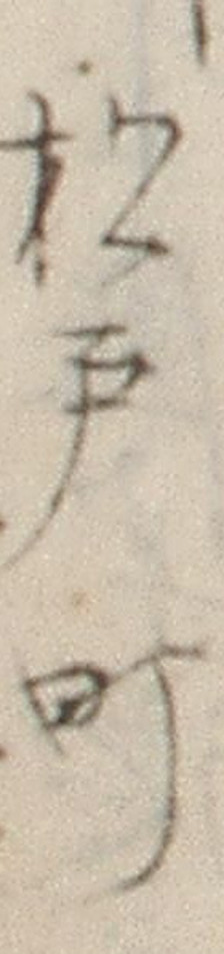松戸町
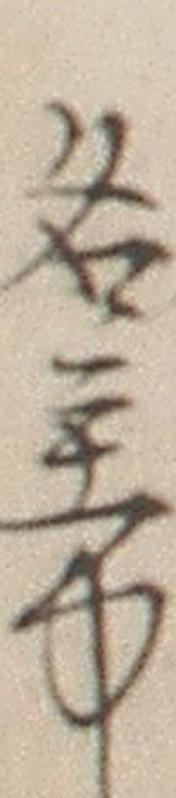名主中

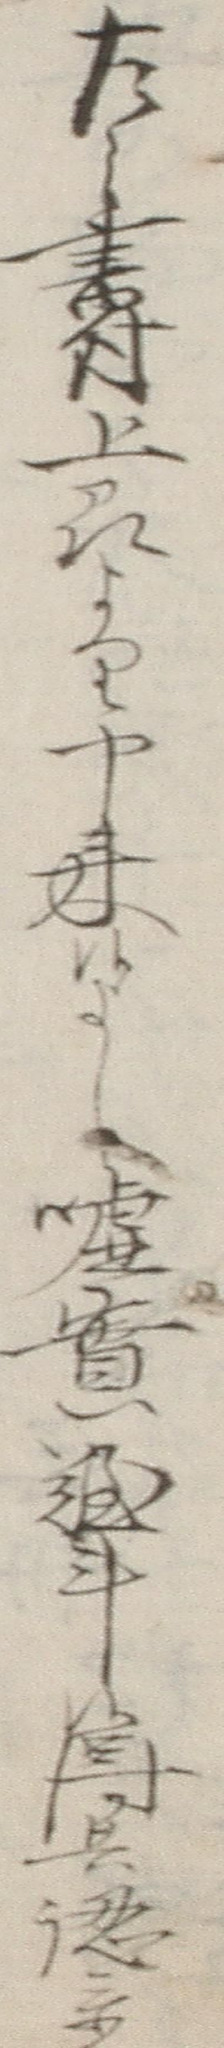左之書付上州より申来候よし虚実ハ難斗候得共認置
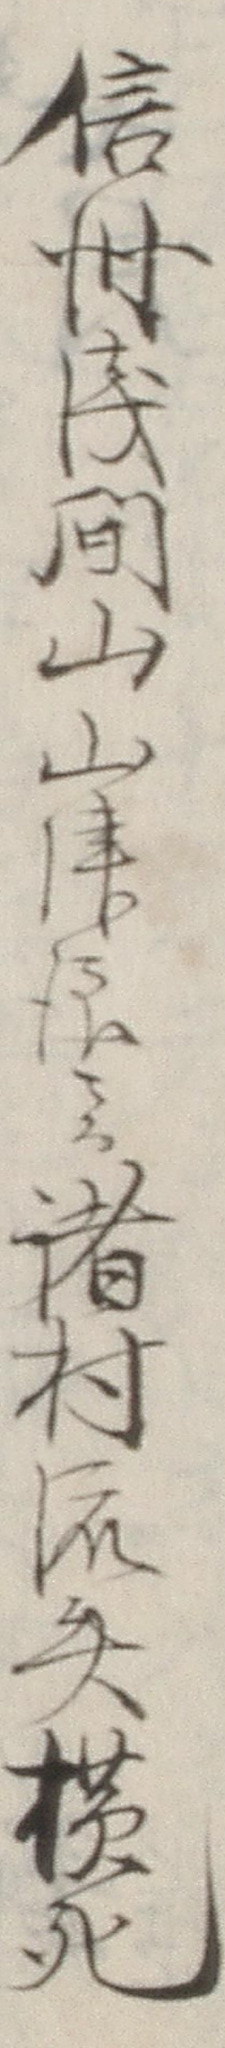信州浅間山山津浪ニ而諸村流失横死
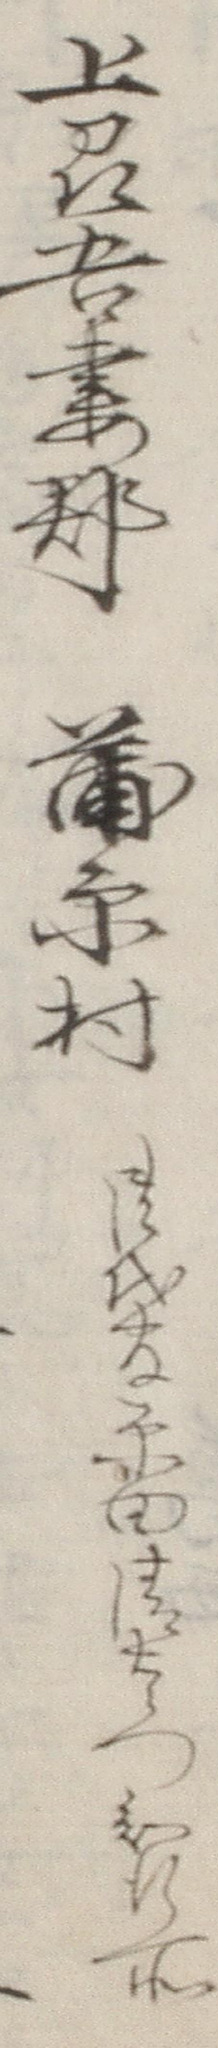一上州吾妻郡蒲原村御代官原田清右衛門知行所
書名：[諸国災害記録]
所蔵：東京大学地震研究所図書室 Earthquake Research Institute Library, The University of Tokyo, JAPAN
